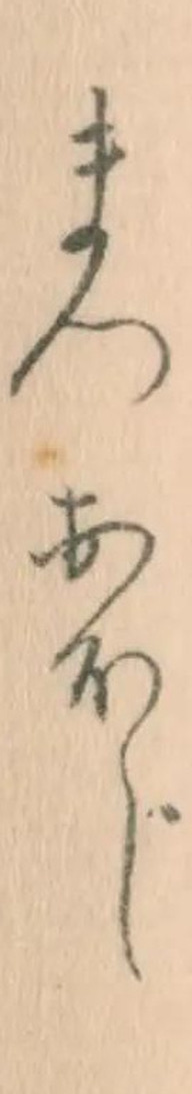まつおほじ
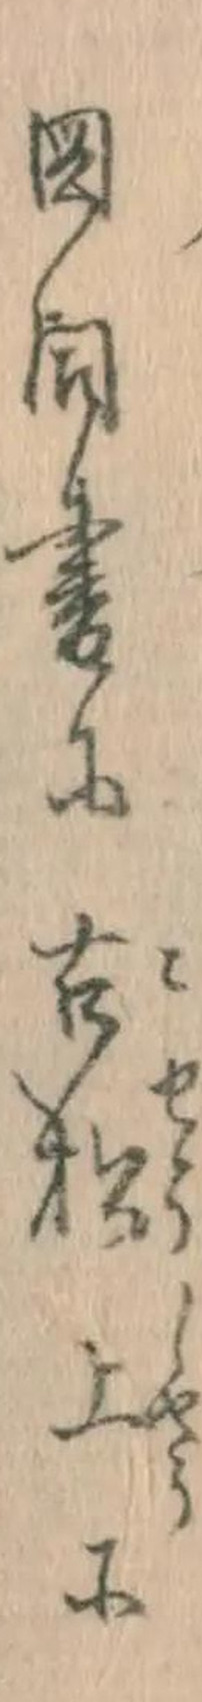図同書に古松上に
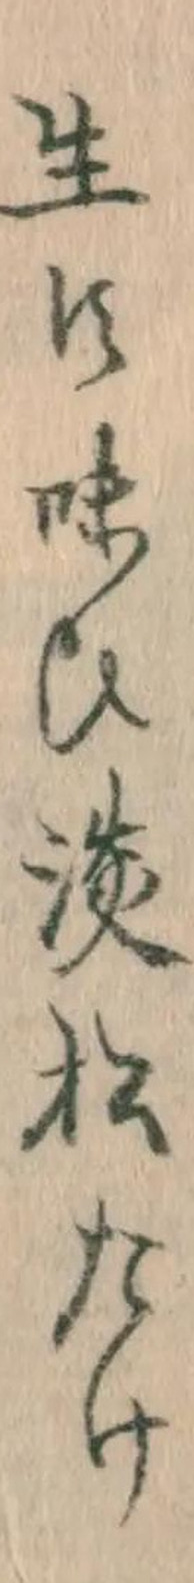生す味ひ淡松たけ
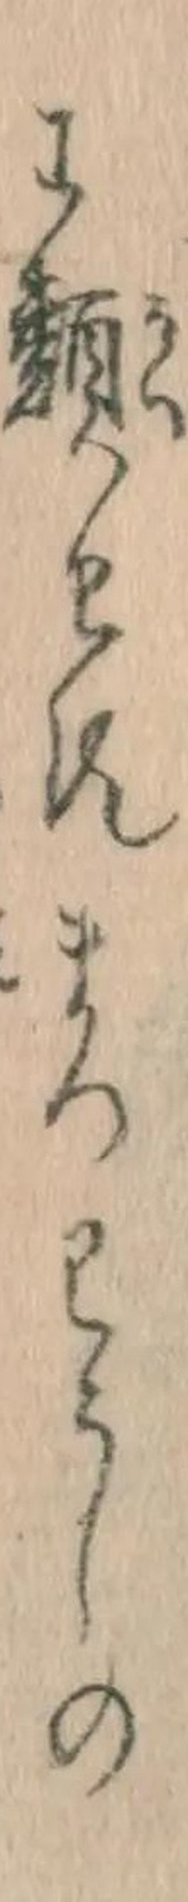に類せすまつわうしの
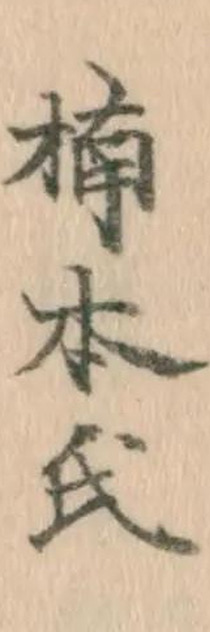楠本氏
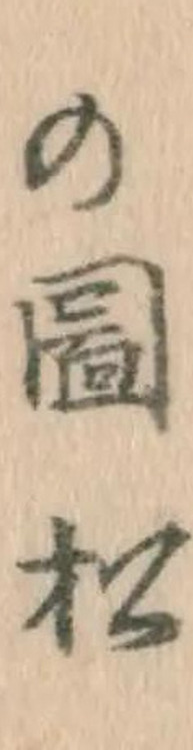の図松
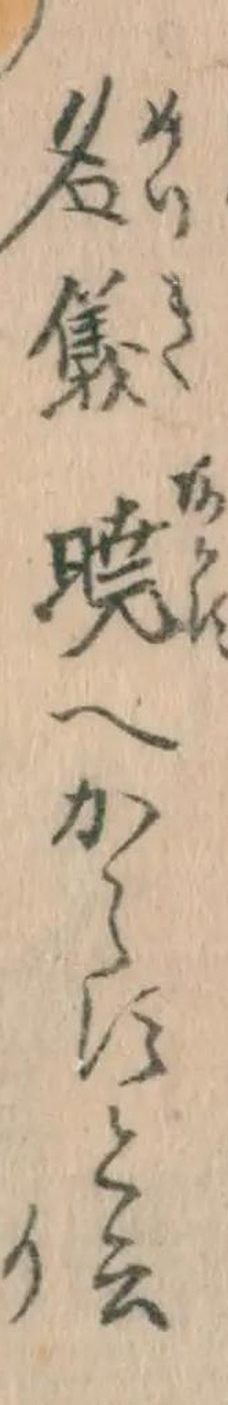名儀暁へからすと云り
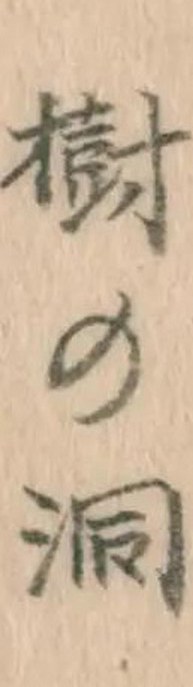樹の洞
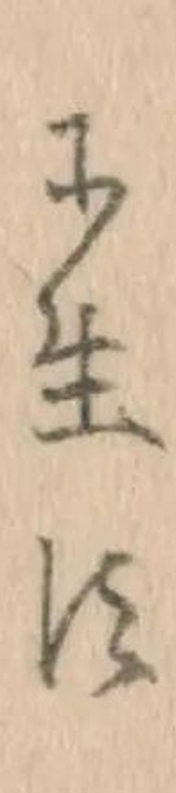に生す

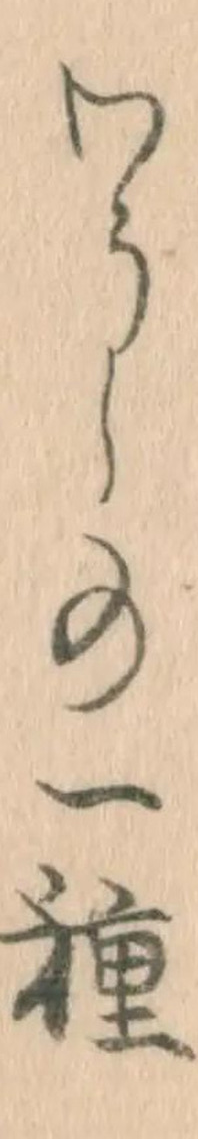わうしの一種
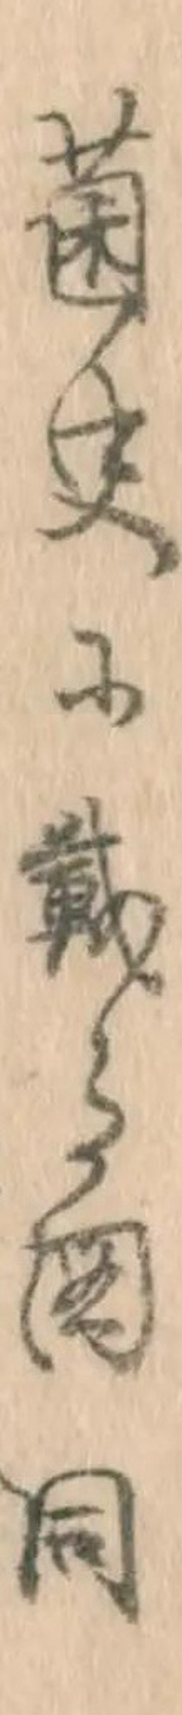菌史に載る図同
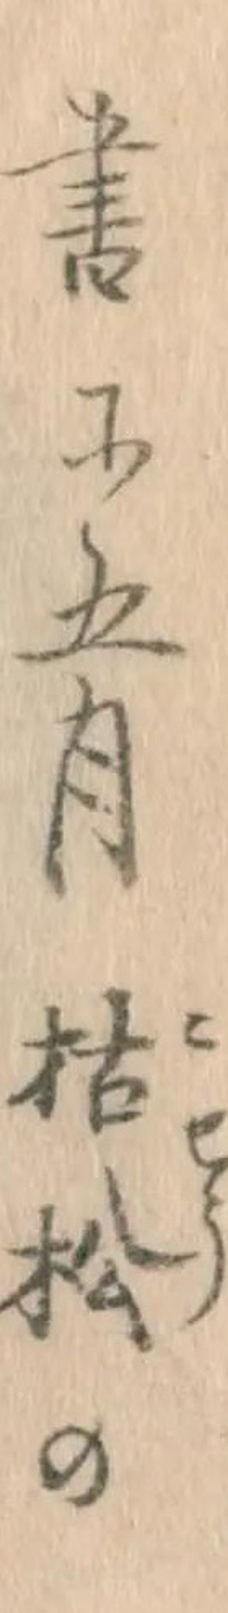書に五月枯松の
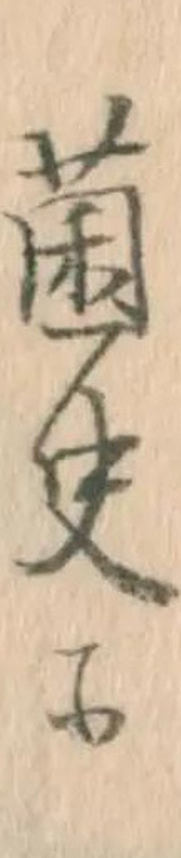菌史に
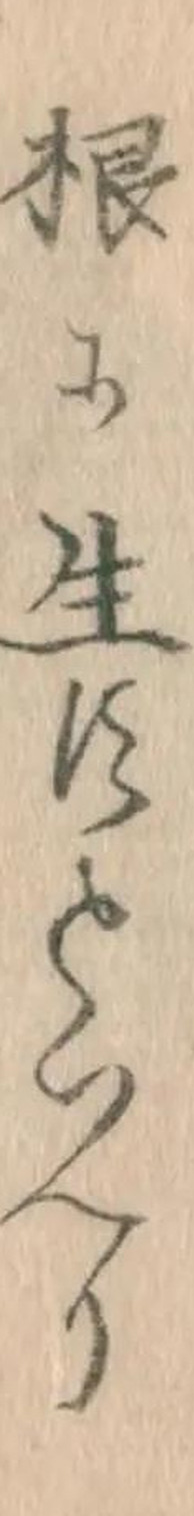根に生すといへり
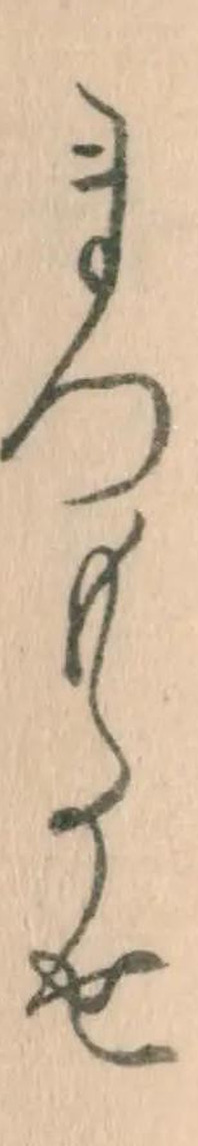まつもたせ
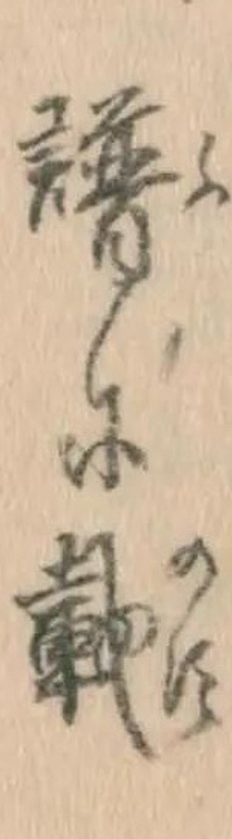譜に載
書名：本草図譜. 巻55-57
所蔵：国立国会図書館 National Diet Library, JAPAN
